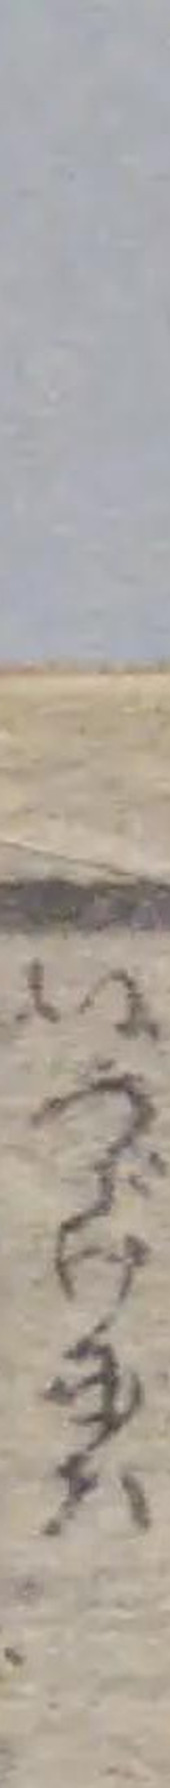いつゞけには
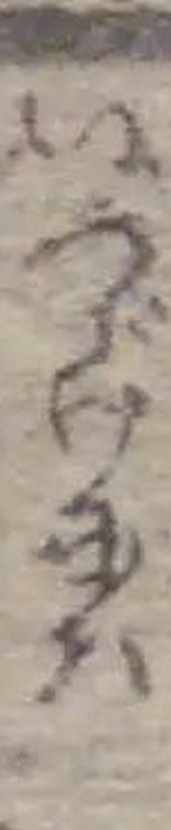いつゞけには
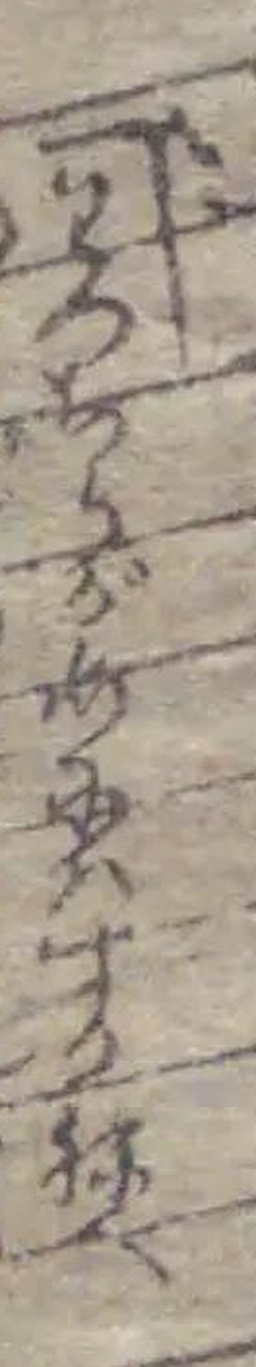〽わつちらがめにはすかねへ
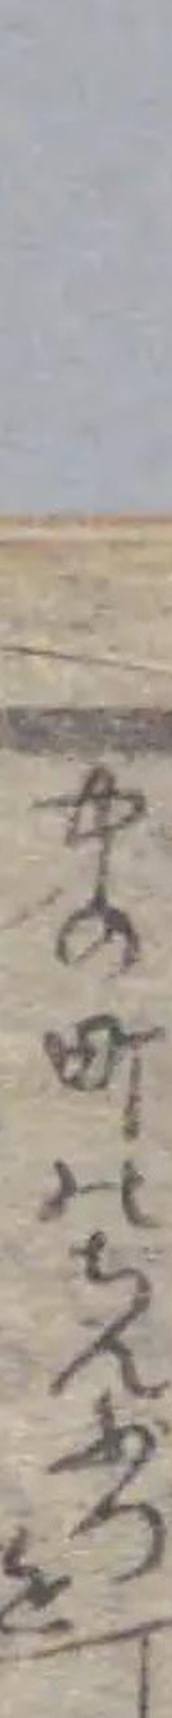中の町のちんぶつ
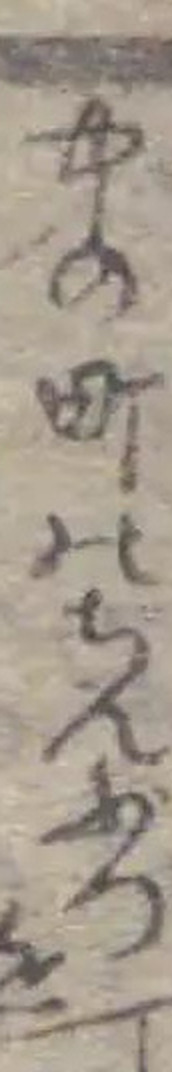中の町のちんぶつ
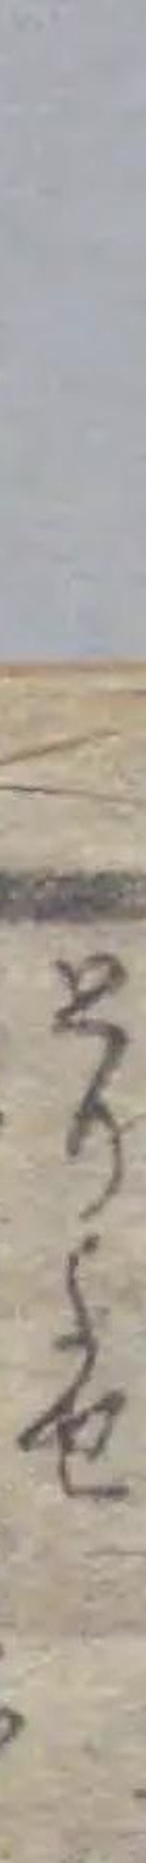とりよせ
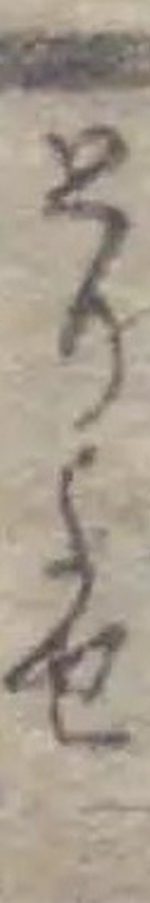とりよせ
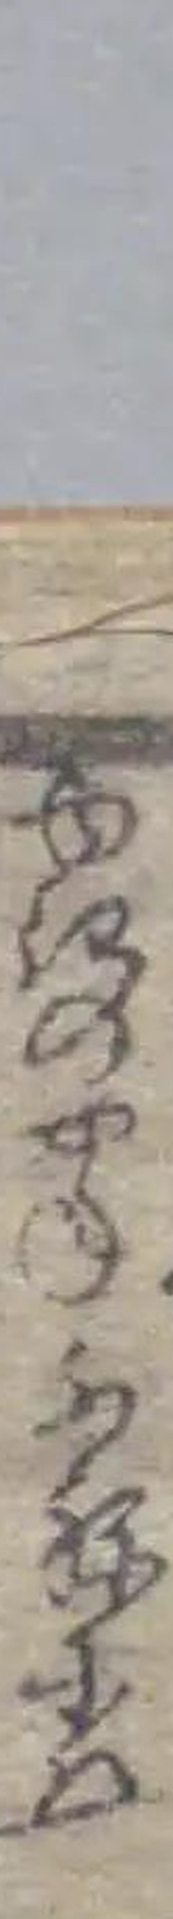ゆきのやねふねには
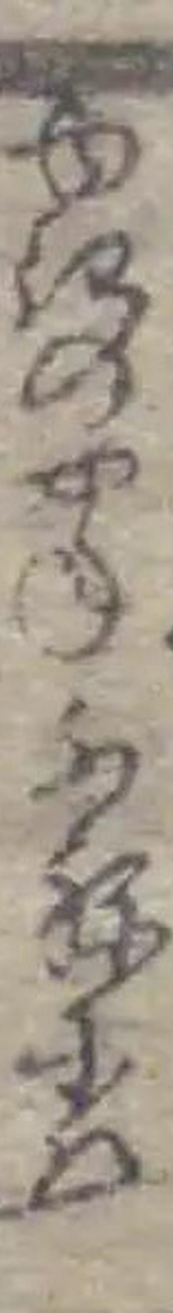ゆきのやねふねには
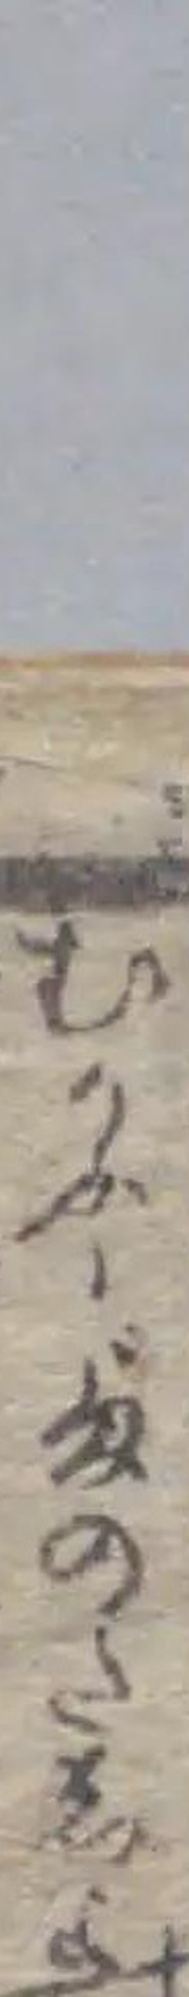むかふしじまのたしよ
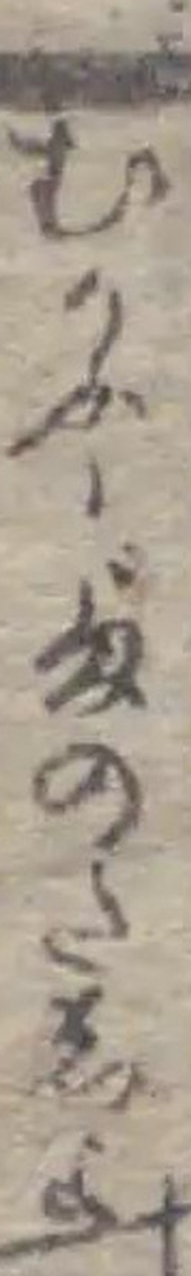むかふしじまのたしよ
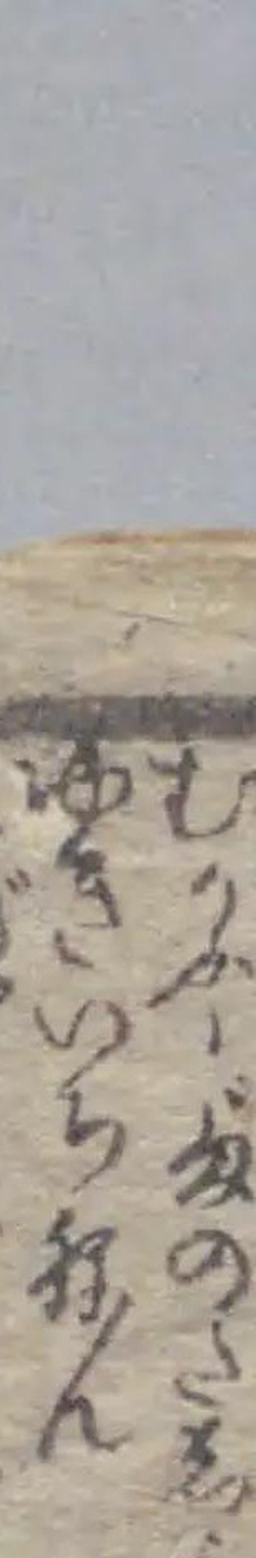ゆきいちねん
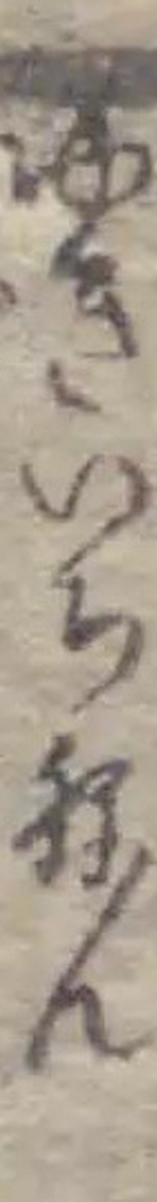ゆきいちねん
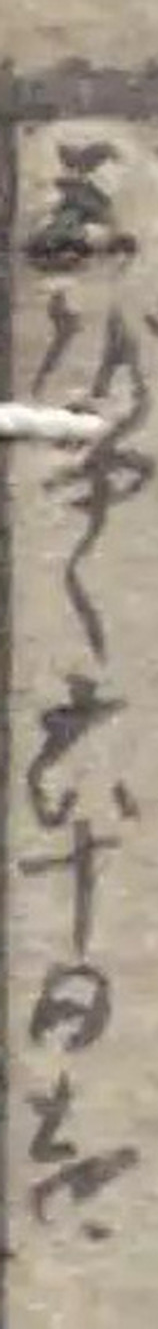さんびやく六十日を
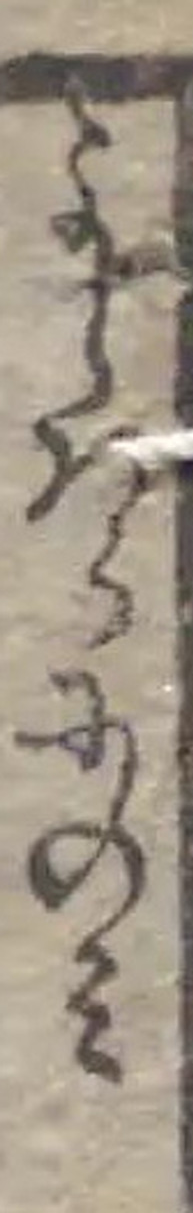よしはらにのみ
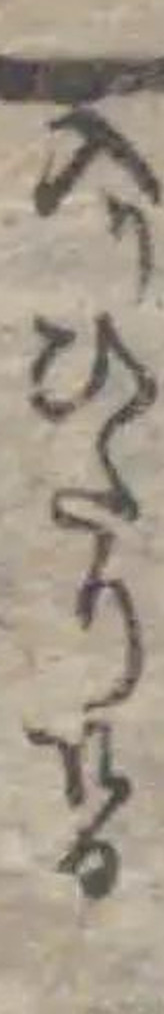入りひたりける
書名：福壽海旡量品玉 3巻
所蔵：国立国会図書館 National Diet Library, JAPAN
